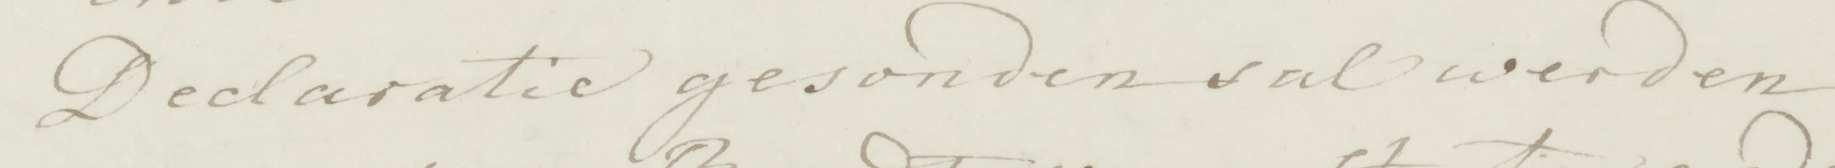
Declaratie gesonden sal werden
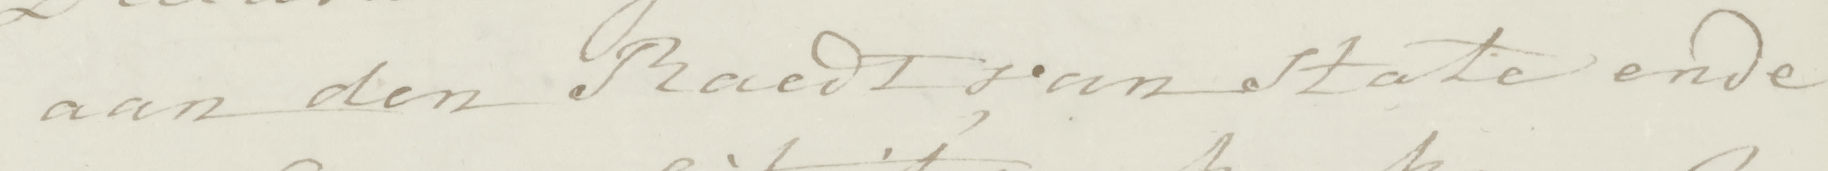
aan den Raedt van State ende
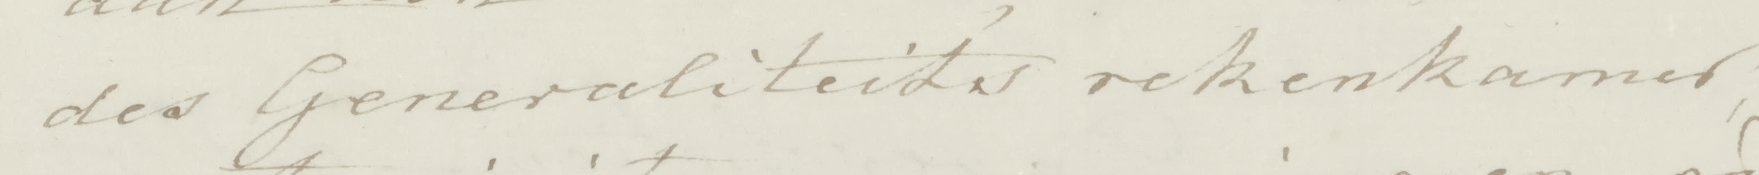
des Generaliteits rekenkamer,
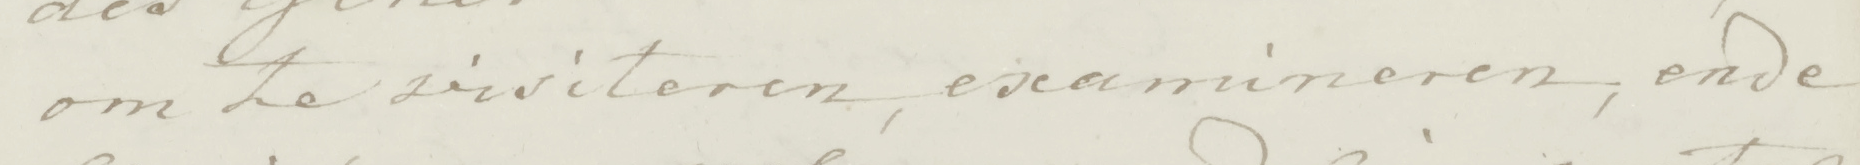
om te visiteren, examineren, ende
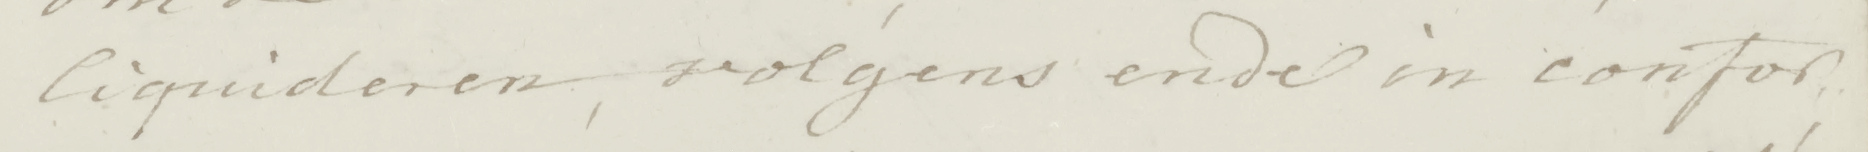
liquideren, volgens ende in confor
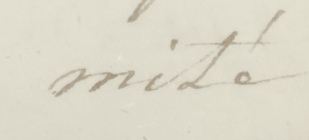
mité
